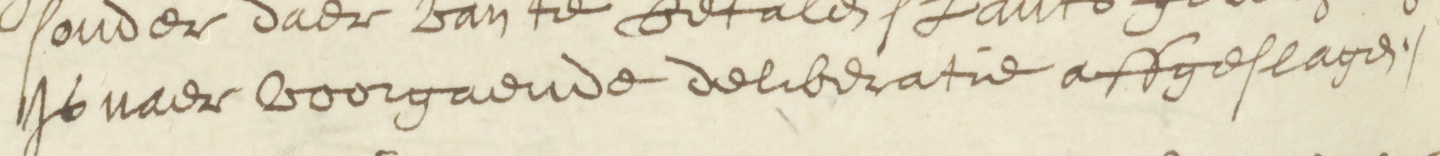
Is naer voorgaende deliberatie affgeslagen.
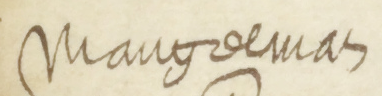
Mangelman
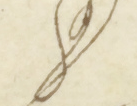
Ca.
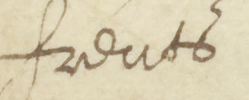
Frents
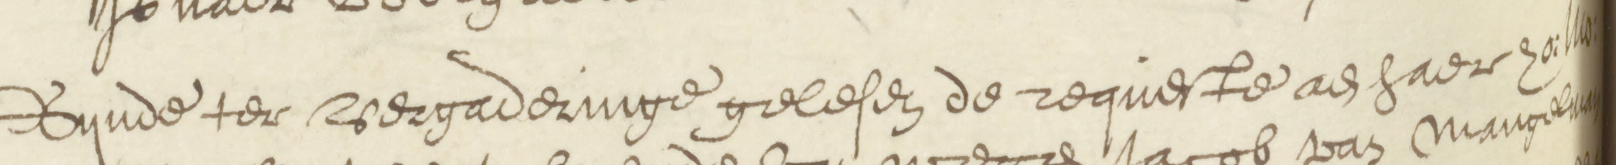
Synde ter Vergaderinge gelesen de requeste aen haer ho:Mo:
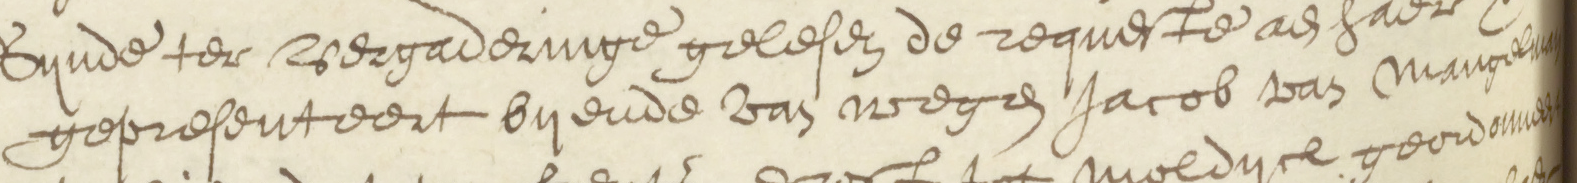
gepresenteert by ende van wegen Jacob van Mangelman
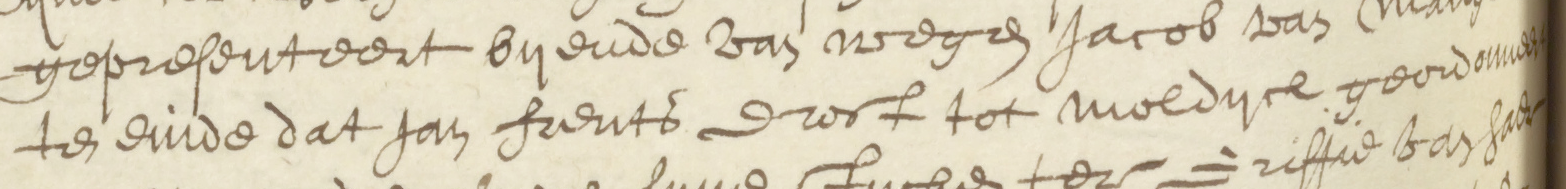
ten einde dat Jan frents Drost tot moldyck geordonneert
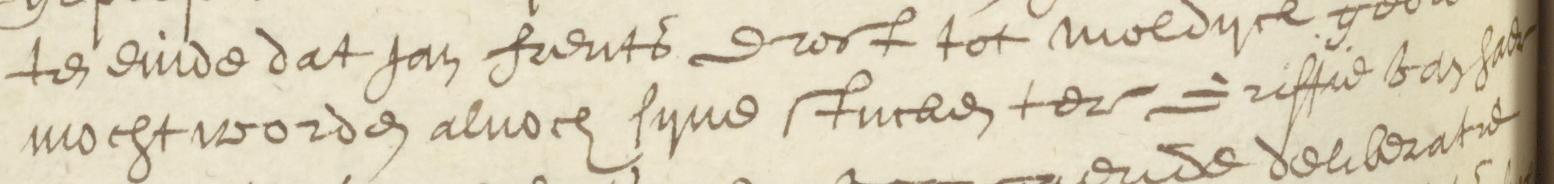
mocht worden alnoch syne stucken ter Griffie van haer
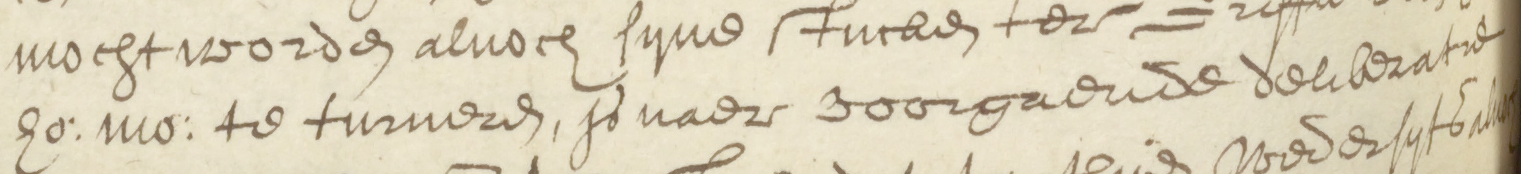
ho:Mo: te furneren, Is naer voorgaende deliberatie
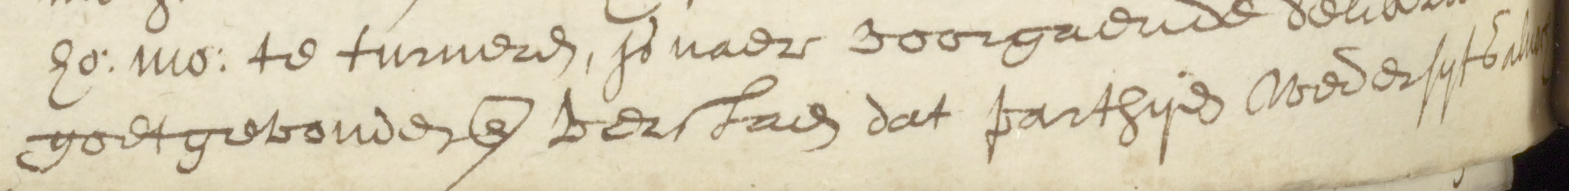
goetgevonden & verstaen dat parthijen wedersyts al
